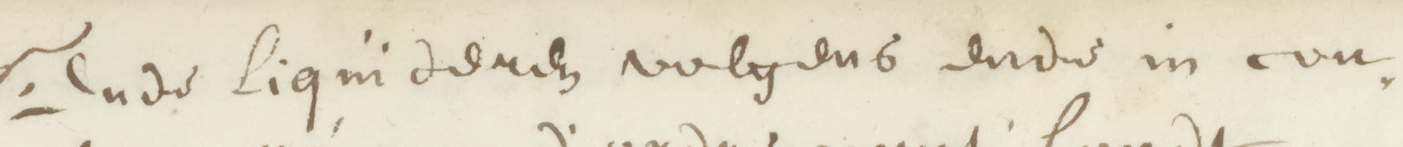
Ende Liquideren volgens ende in con„
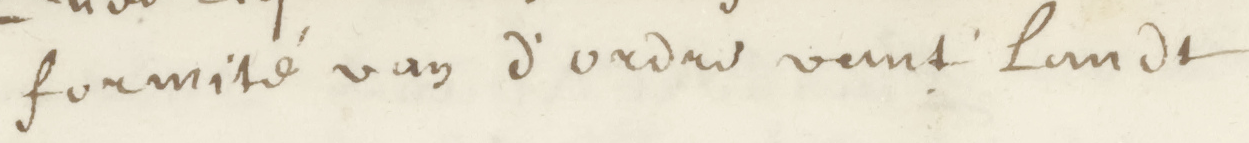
formité van d‛ordre vant Landt
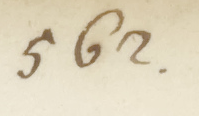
562.
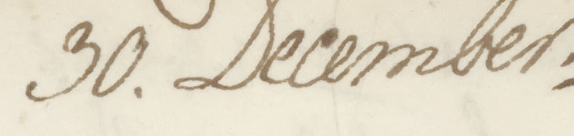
30. December
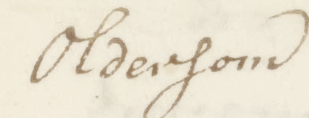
Oldersom
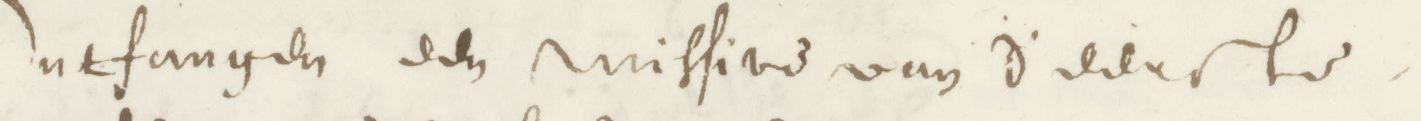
Ontfangen een Missive van d‛eerste
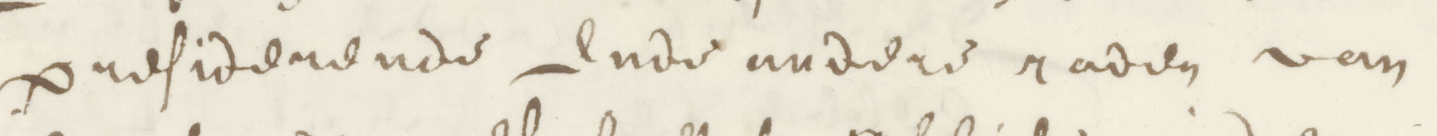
presiderende Ende andere raden van
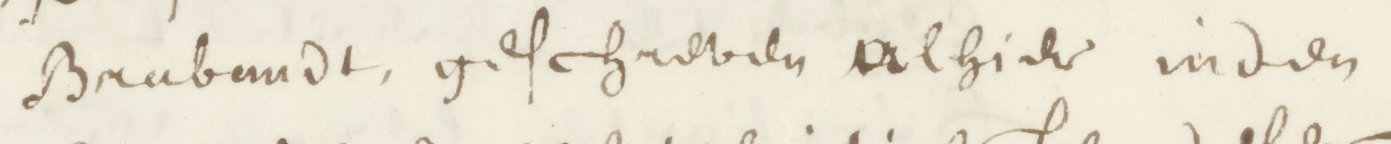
Brabandt, geschreven alhier inden
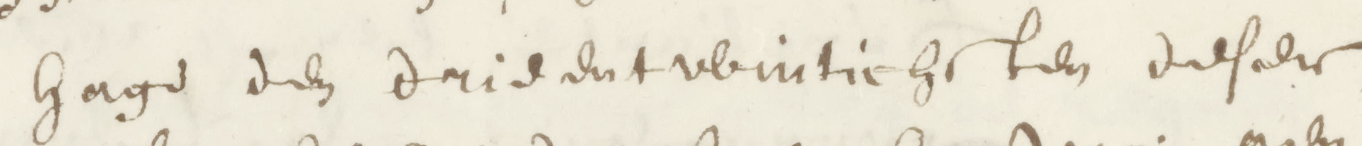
hage den drieentwintichsten deser,
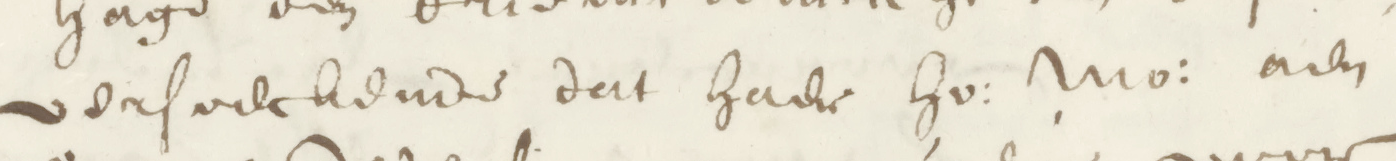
versoeckende dat haer ho:Mo: aen
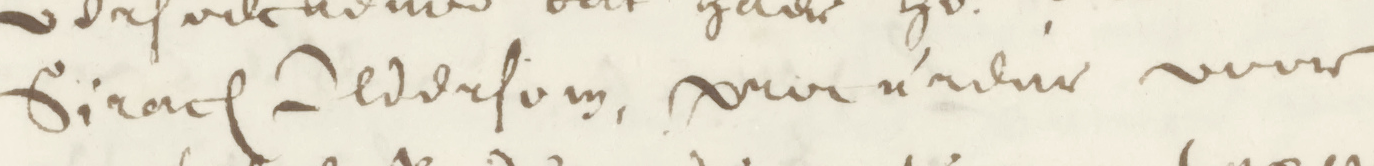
Sirach Oldersom, procureur voor
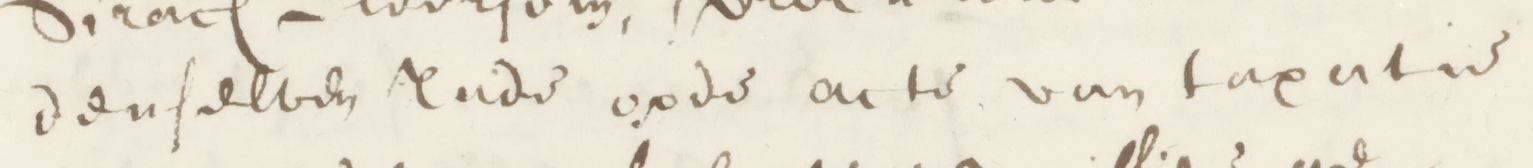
denselven Rade opde acte van taxatie
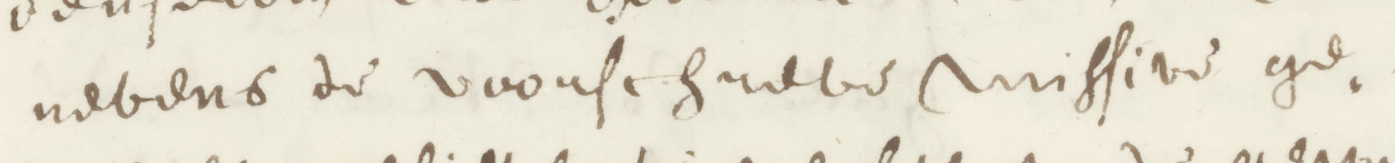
nevens de voorschreve Missive ge„
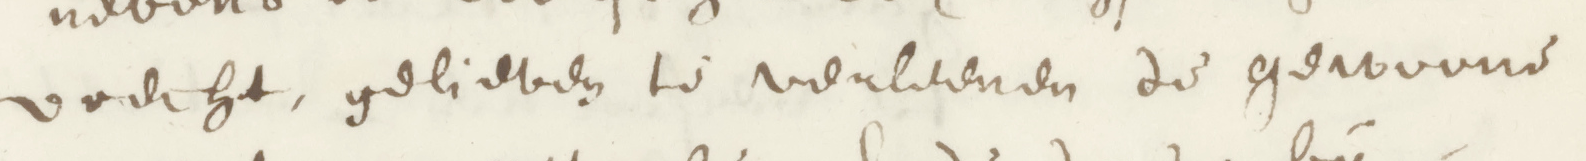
voecht, gelieven te verleenen de gewoone
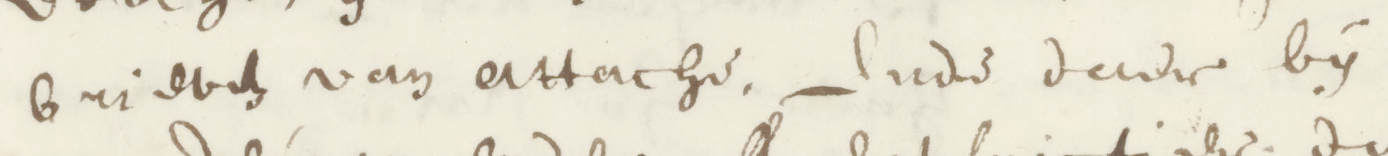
brieven van attache. Ende daer bij
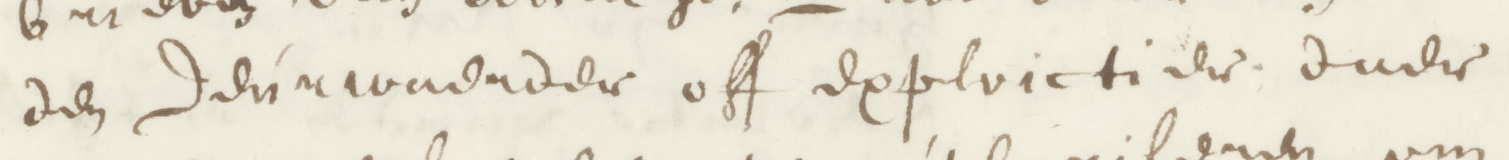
den Deurwaerder off exploictier daer
